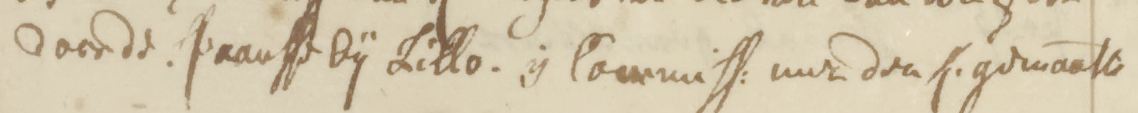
door de Fransse bij Lillo. is Commiss: met den R. gemaekt
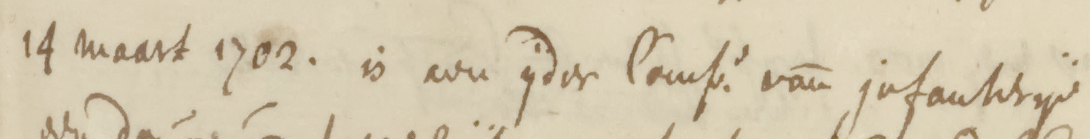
14 maert 1702. is aen ijder Compe. van infanterije
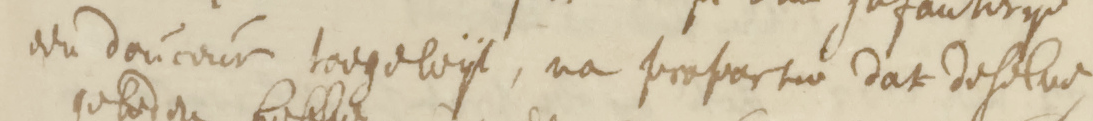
een douceur toegeleijt, na proportie dat deselve
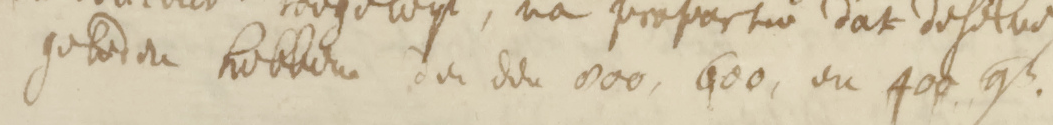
geleden hebben den een 800, 600 en 400 gls.
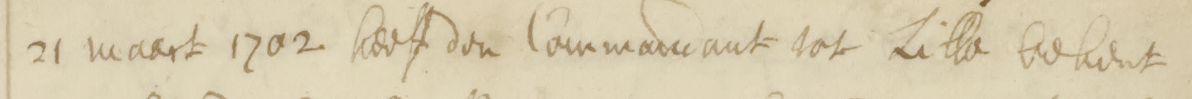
21 maert 1702 heeft den Commandant tot Lillo bekent
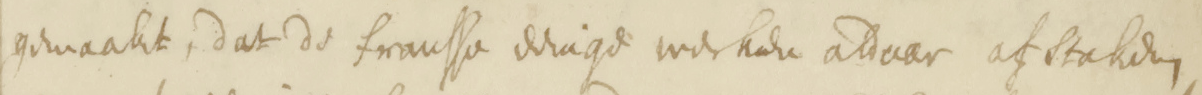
gemaakt, dat de fransse eenige werken aldaar afstaken,
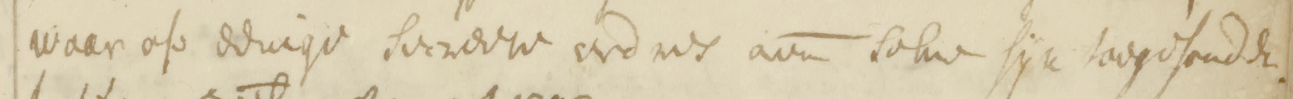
waer op eenige secreete ordres aen selve sijn soegesonden.
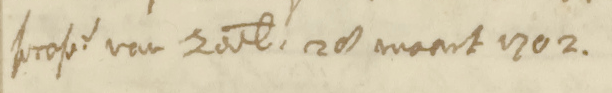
prope. van zeel. 28 maart 1702.
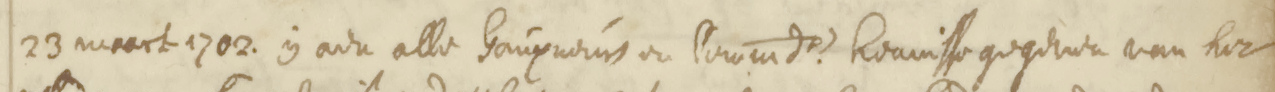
23 maart 1702. is aen alle Gouverneurs en Commds. kenisse gegeven van het
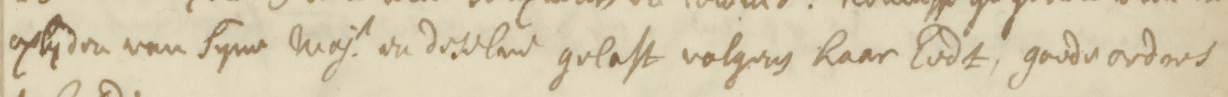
ovlyden van Sijne Majt. en deselve gelast volgens haar Eedt, goede ordres
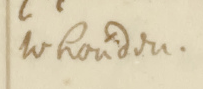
te houden.
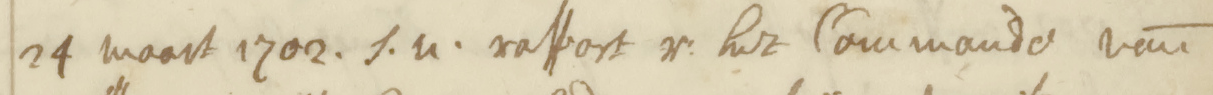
24 maart 1702. s. n. rapport v. het Commando van
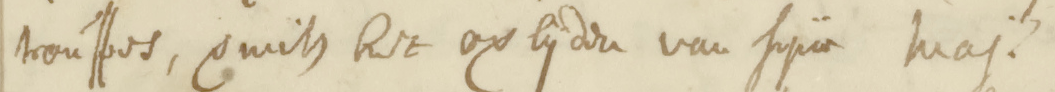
trouppes, vmits het ovlijden van Sijne Majt.
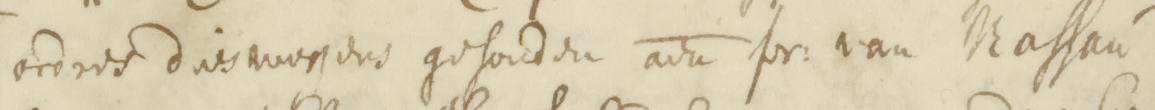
ordres dieswegens gesonden aen Pr: van Nassau
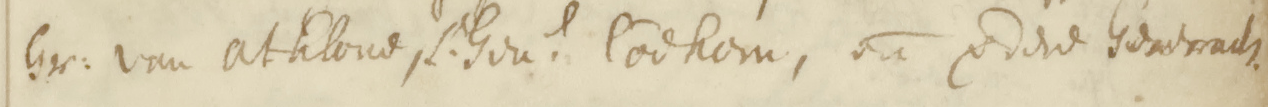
Gr. van Athlone, Lt. Genl. Coekem, en vdere Generaels
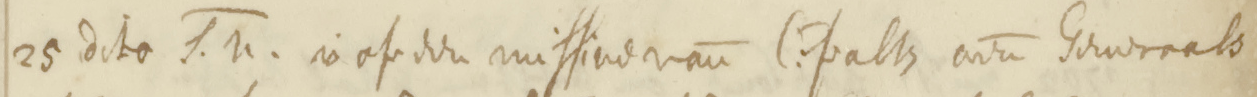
25 dito s.n. is op een missive van C: Paltz aen Generaals
